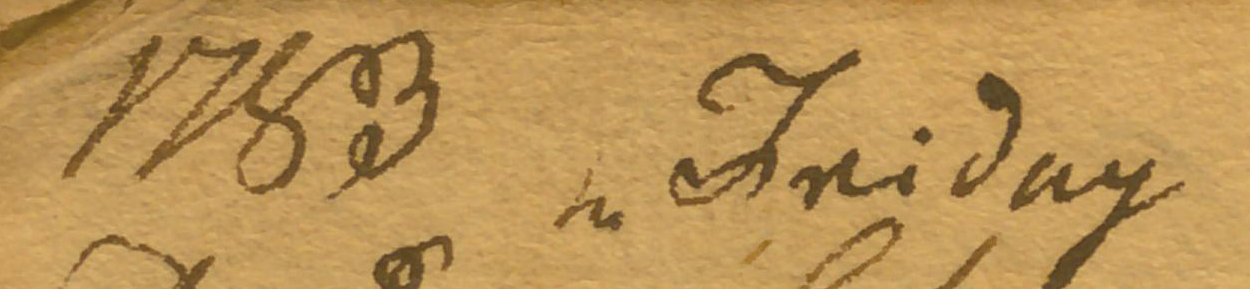1783 Friday
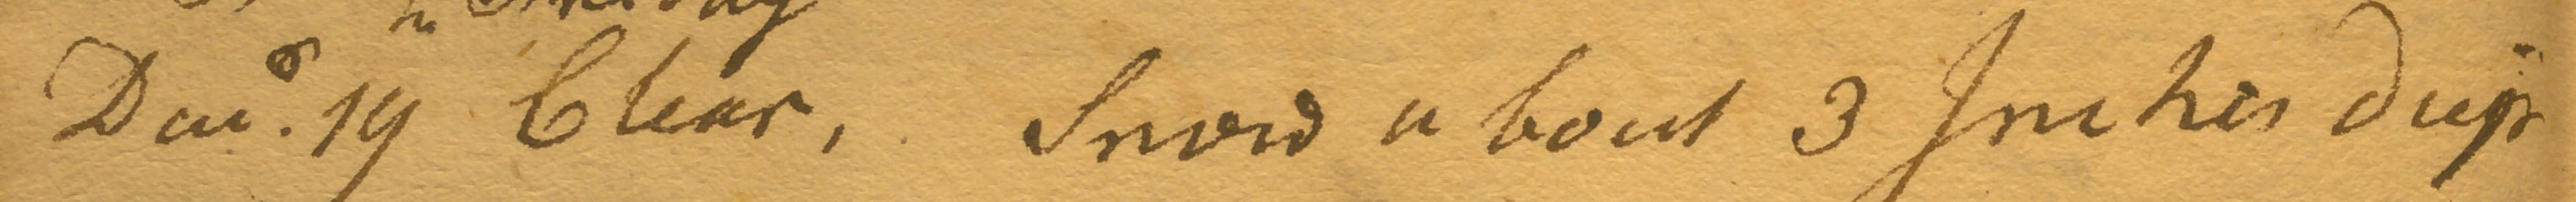Dec^r. 19^th Clear. snow about 3 Inches deep
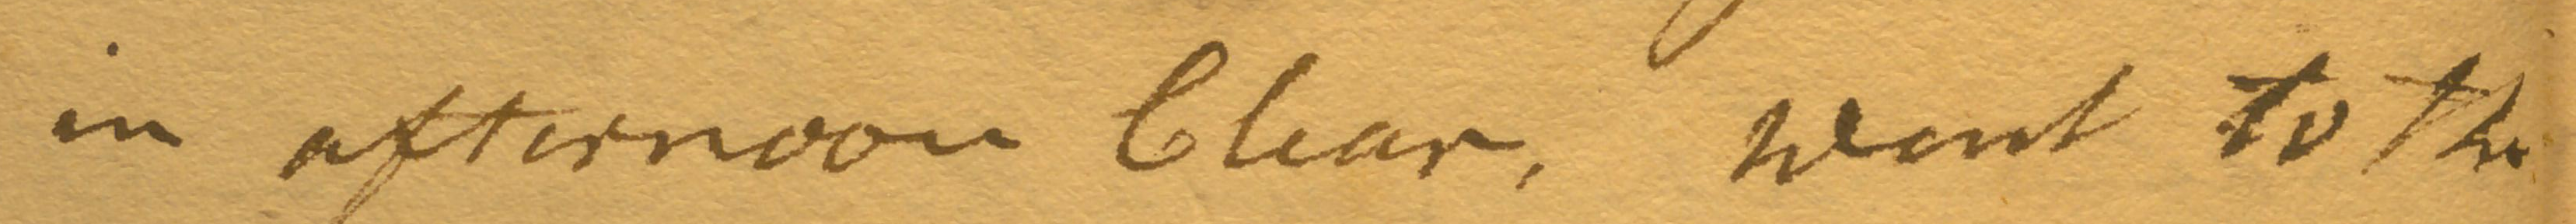in afternoon Clear, went to the
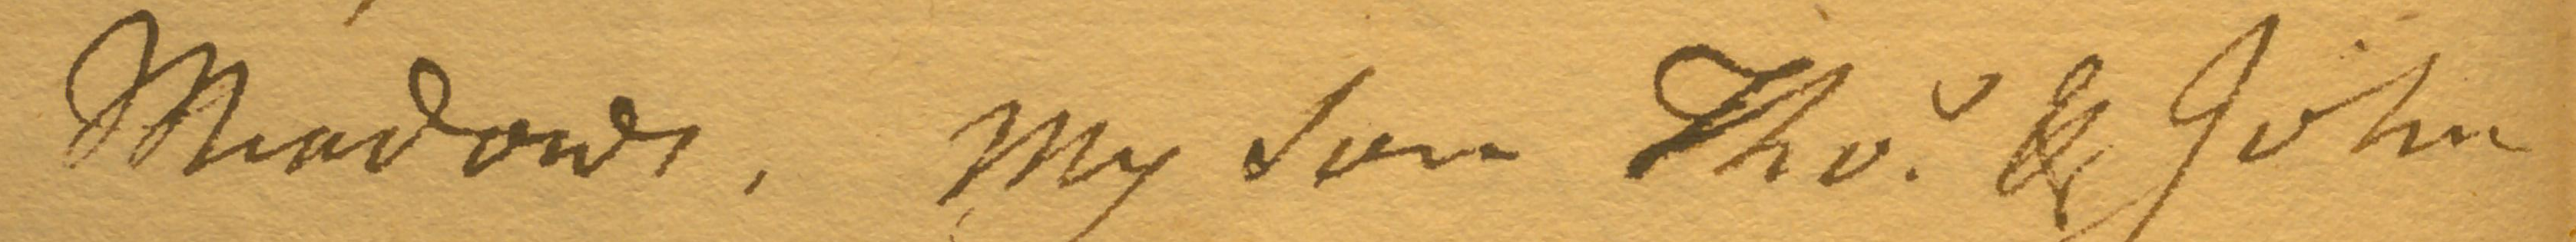Meadows. My son Tho^s. & John
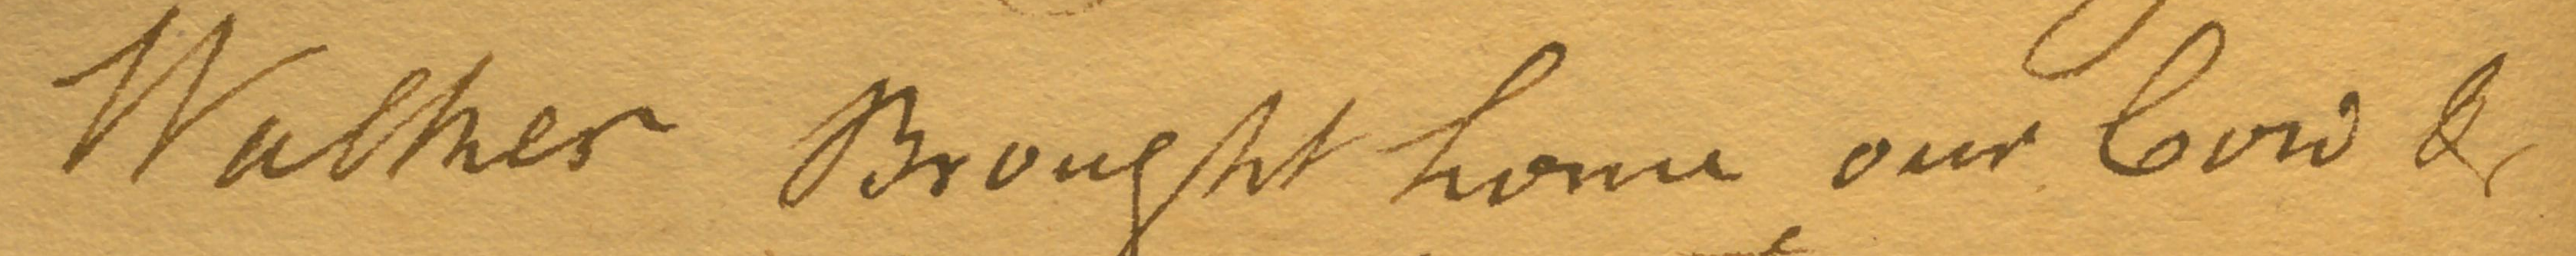Walker Brought home our Cow &
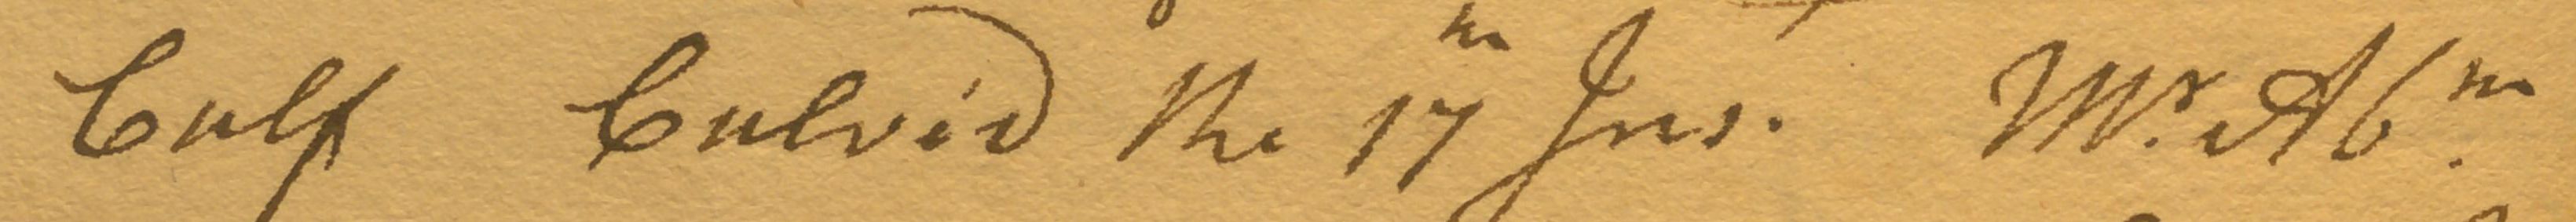Calf Calved the 17^th Ins^t. M^r. Ab^m.
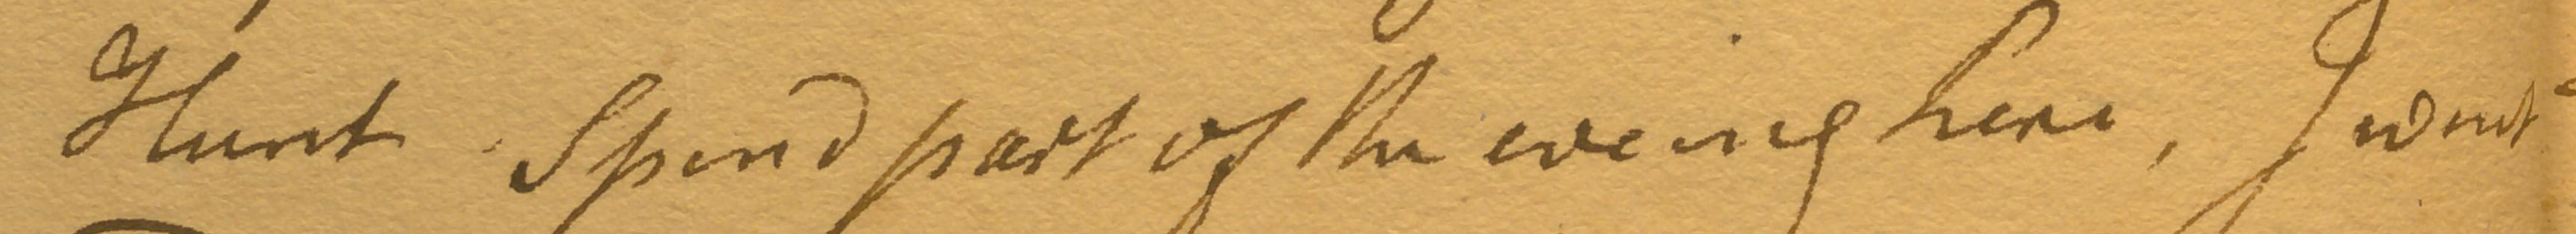Hunt Spend part of the eveing here, I went
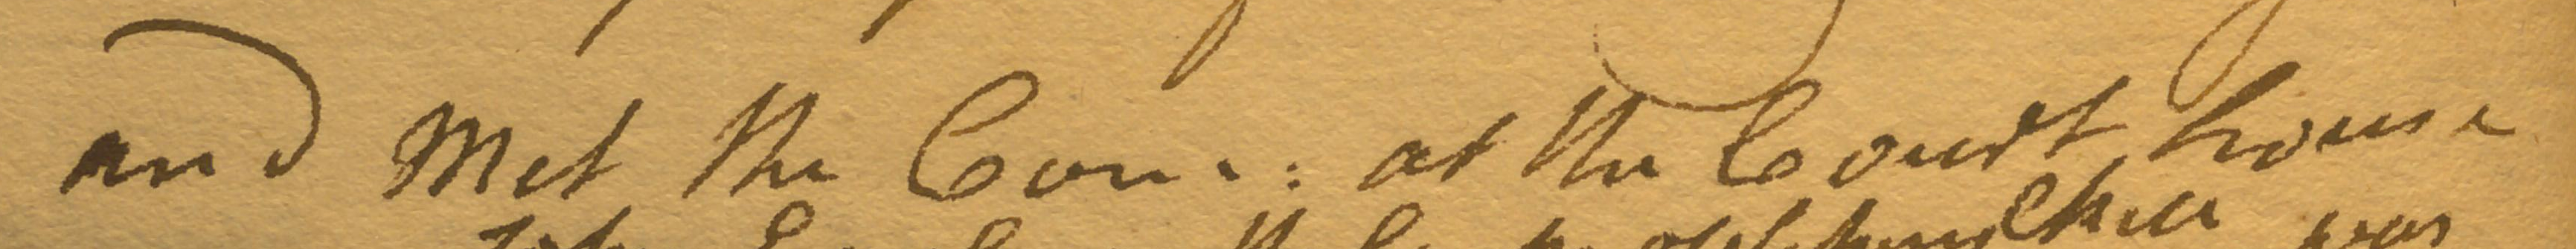and Met the Con: at the Court, house
